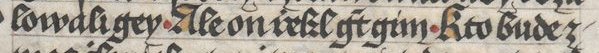lowali gey.Ale on ṙekl ḡt gim.Kto bude z¬
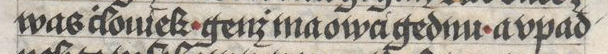was ċlouiek.genż ma owci gednu.a vpad¬
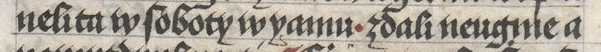nelita w ſoboty w yamu.zdali neugme a
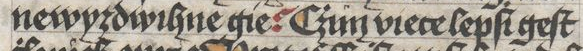newyzdwihne gíe? Cżiní viece lepẛi geſt
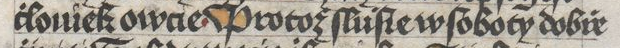ċlouiek owcie.Protoż ſluẛie v ſoboty dobře
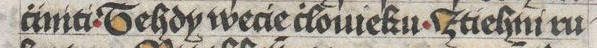ċiniti.Tehdy wecie ċlouieku.Ztiehni ru¬
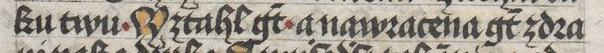ku twu.Y ztahl ḡt.a nawracena ḡt zdra¬
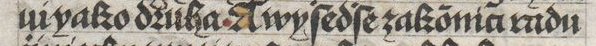ui yako druha.A wyẛedẛe zakōnici radu
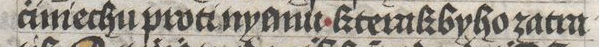ċiniechu proti nyemu.kterakbyho zatra¬
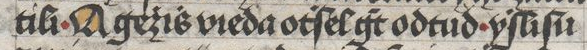tili.A geżiṡ vieda otẛel ḡt odtud.yẛli ſu
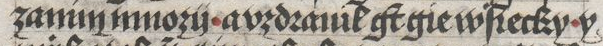zanim mnozij.a vzdrauil ḡt gie wẛiecky.y
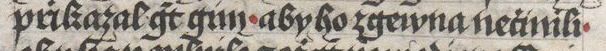pṙikazal ḡt gim.aby ho zgewna neċinili.
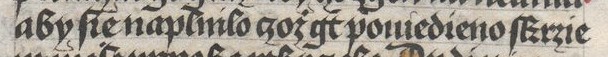aby ſie naplnilo czoż ḡt pouiedieno ſkrzie
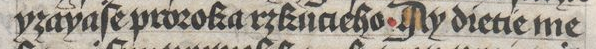yzayaẛe proroka rzkucieho.Ay dietie me
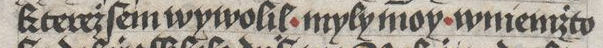ktereż ſem wywolil.myly moy.wníemżto
